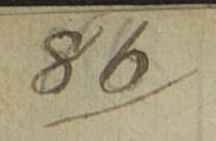86
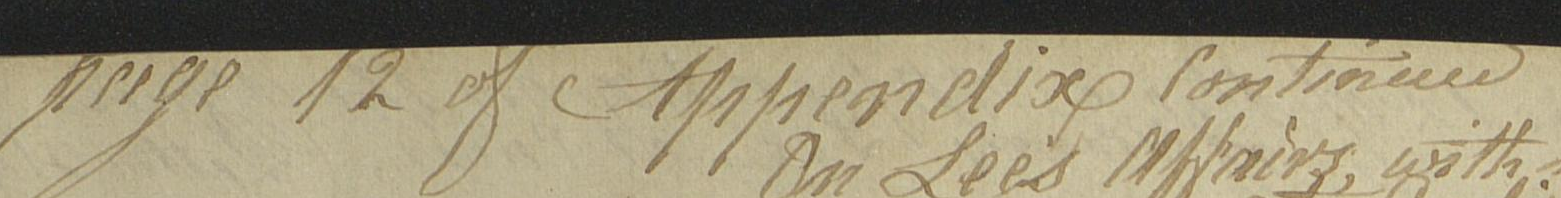page 12 of Appendix Continued
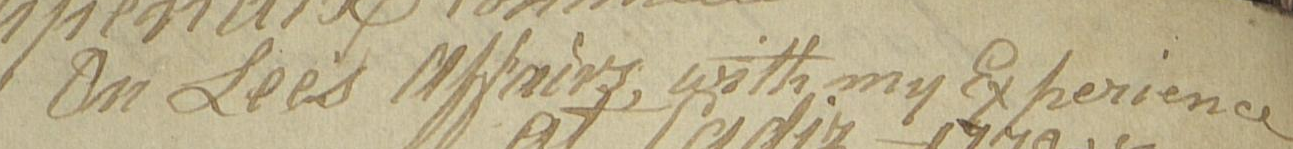On Lees Affairs, with my Experience
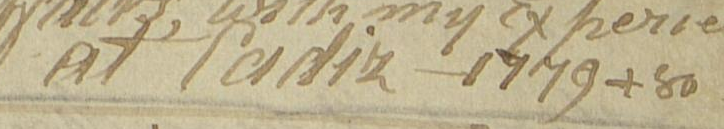At Cadiz 1779 & 80
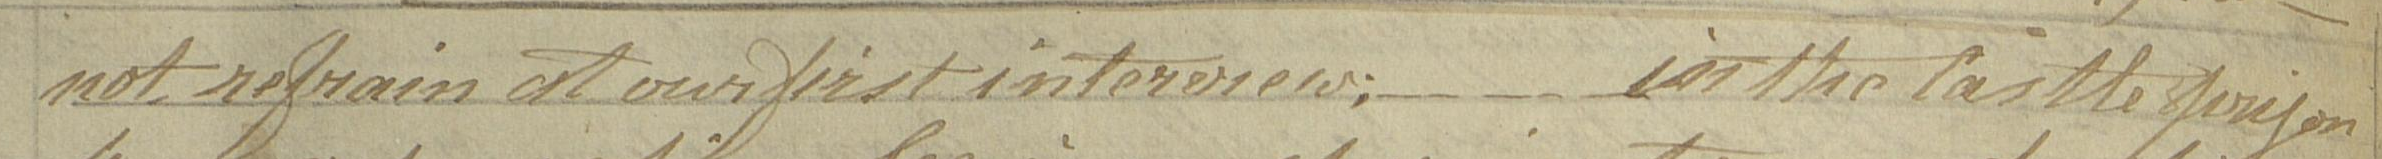not refrain at our first interview; in tho Castle prison
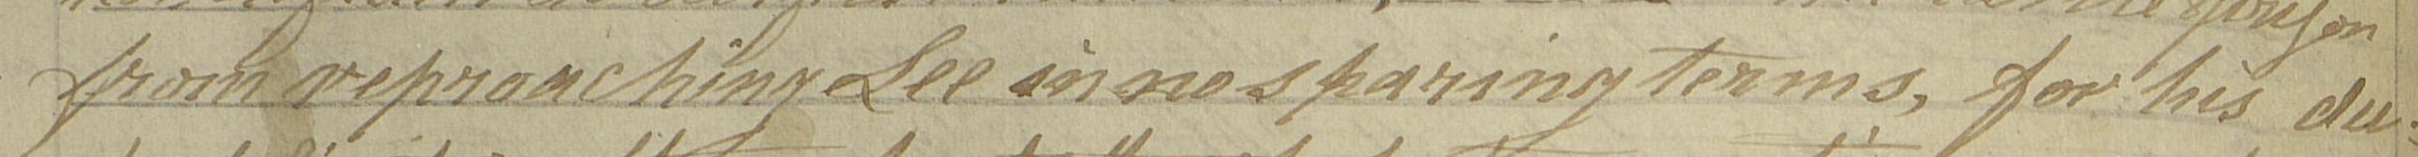from reproaching Lee in no sparing terms, for his du-
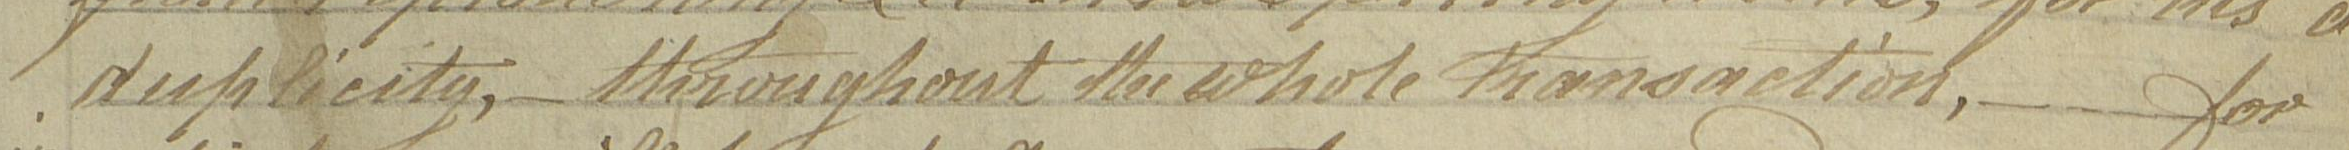duplicity, throughout the whole transaction, for
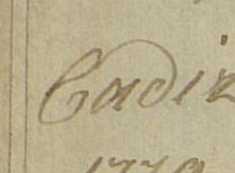Cadiz
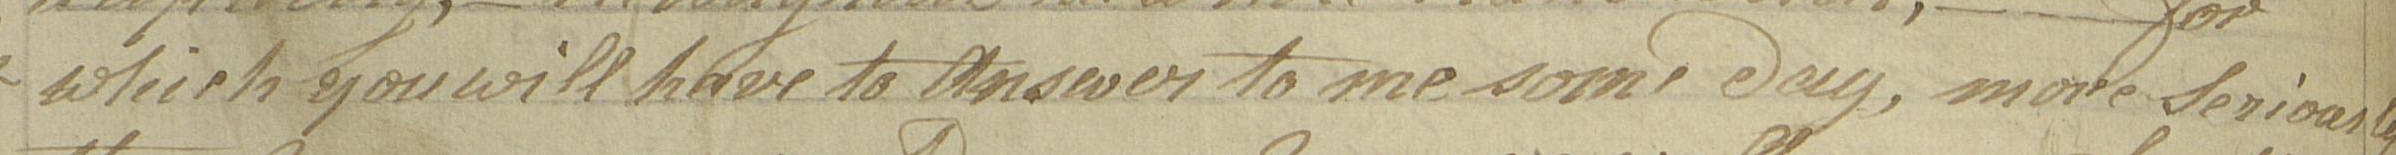which you will have to answer to me some day, more seriously
